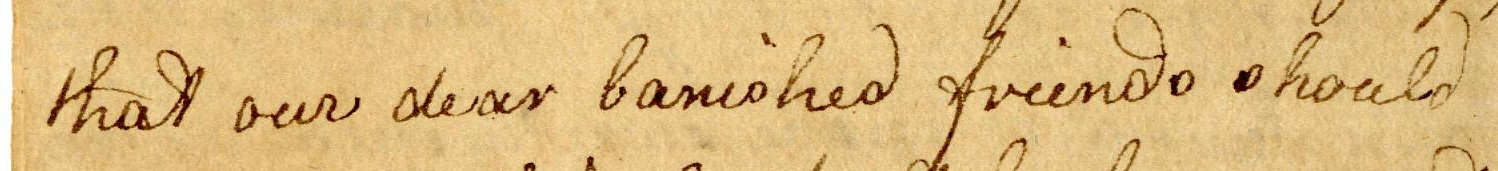that our dear banished friends should
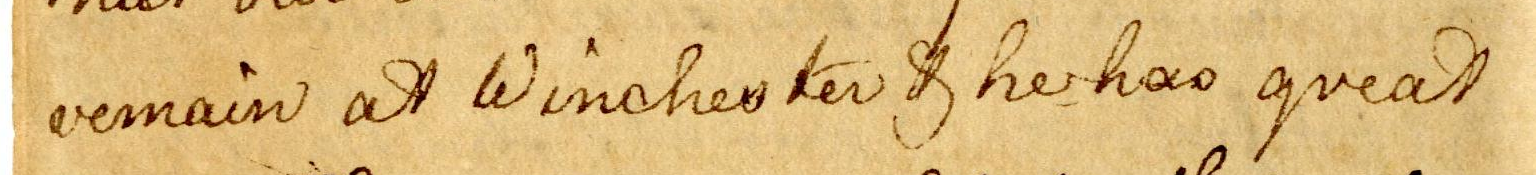remain at Winchester & he has great
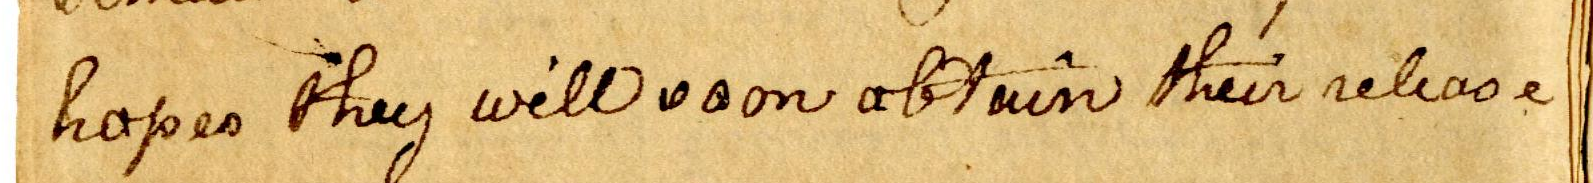hopes they will soon obtain their release
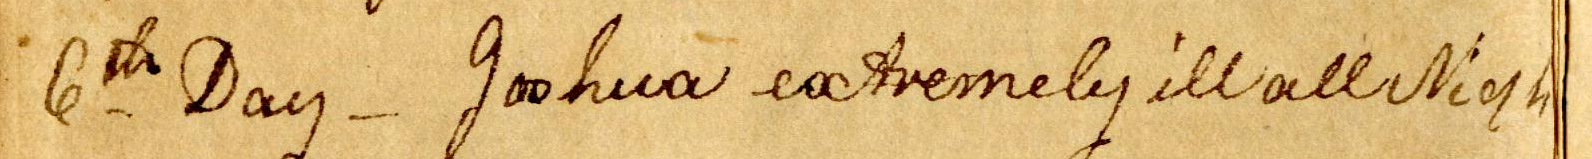6^th Day- Joshua extremely ill all Nigh
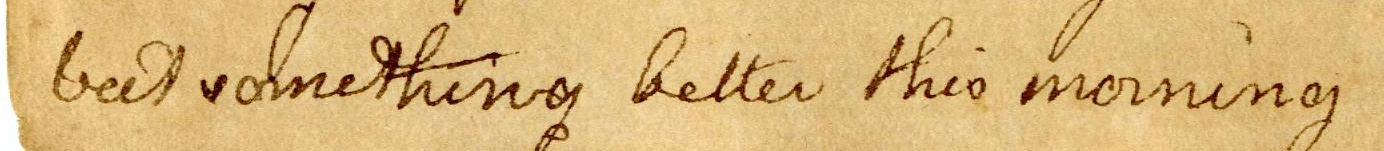but something better this morning
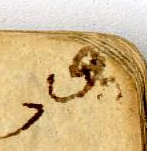9
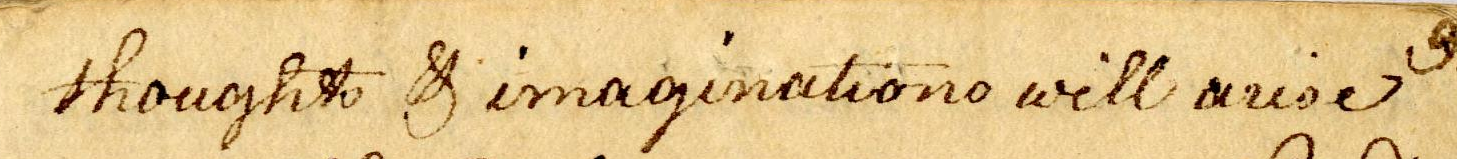thoughts and imaginations will arise
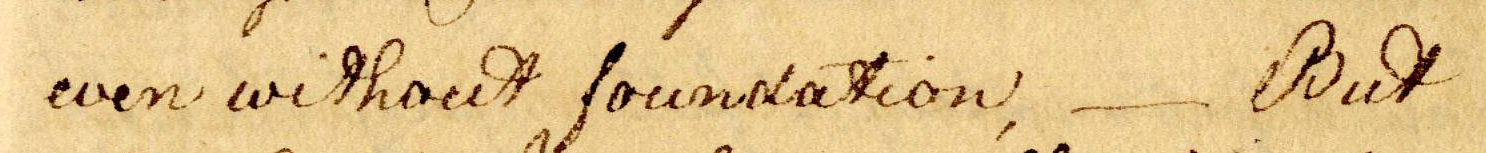even without foundation- But
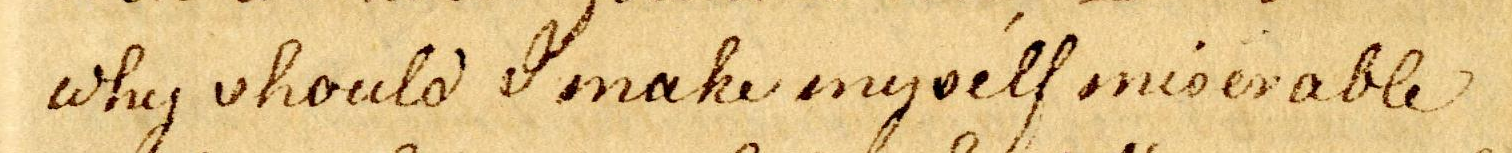why should I make myself miserable
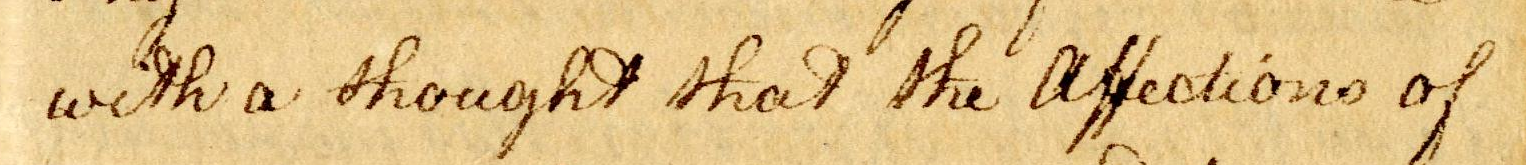with a thought that the Affections of
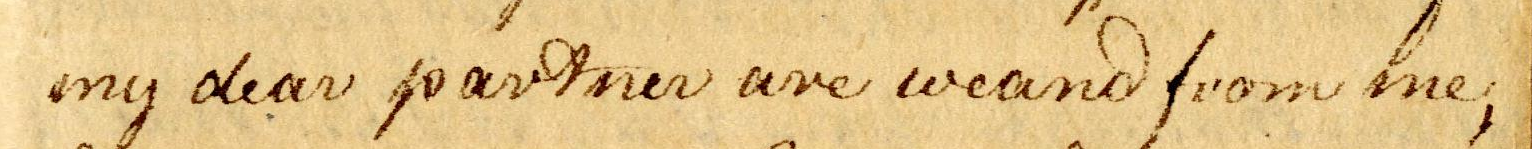my dear partner are weand from me,
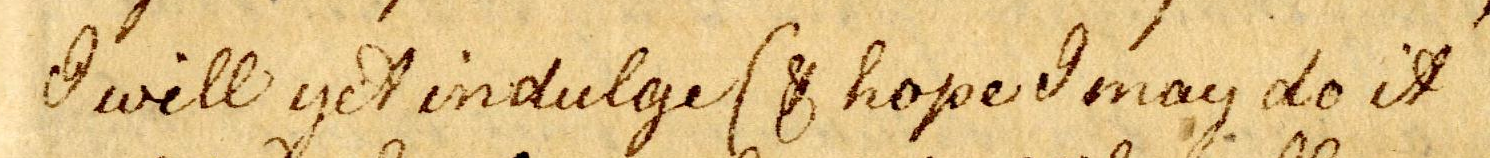I will yet indulge (& hope I may do it
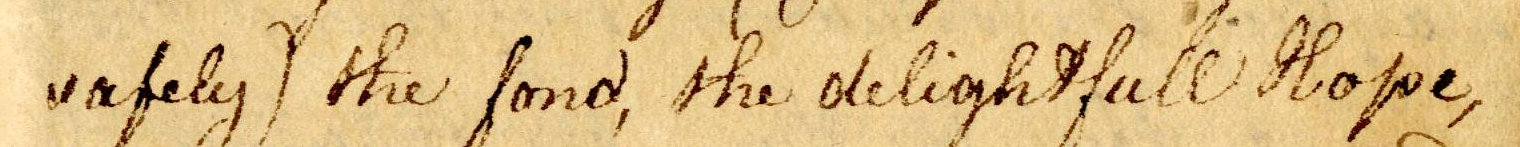safely) the fond the delightfull Hope,
